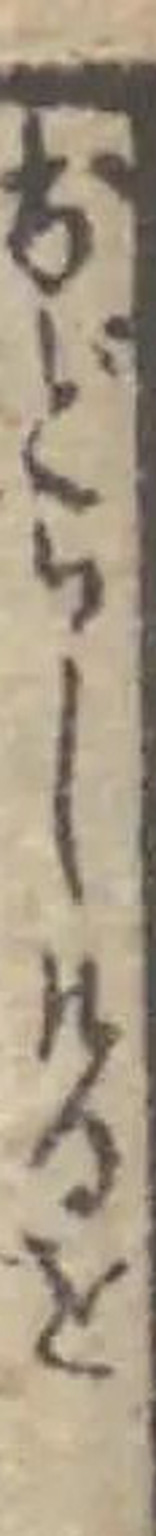おどかしけるを
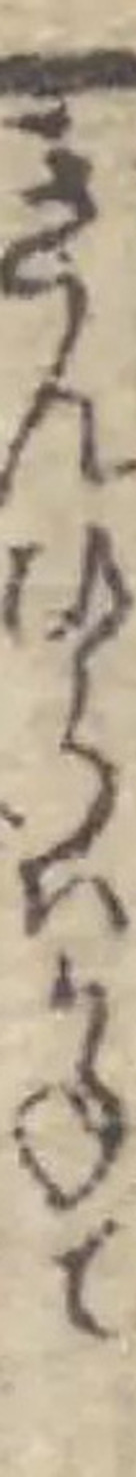きんひらはかねて
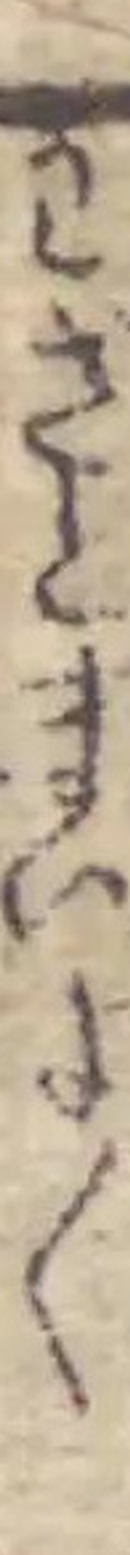わざとまいよ〳〵
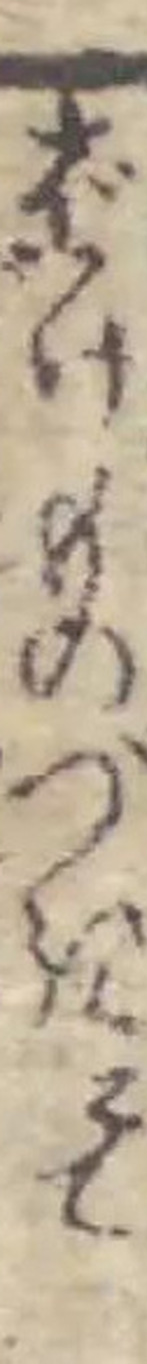ばけものづきにて
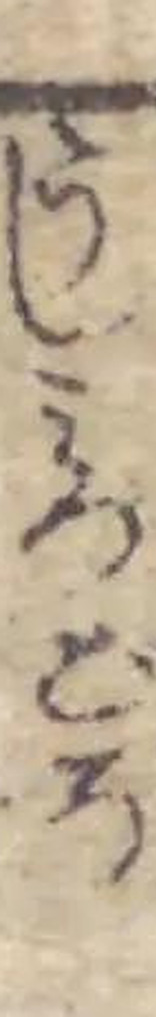うしみつごろ
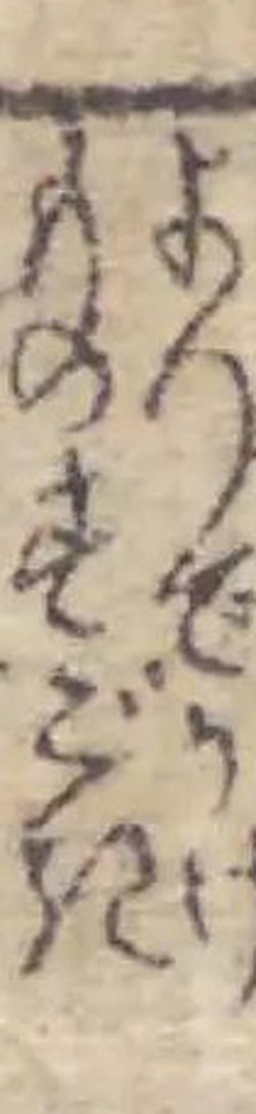ものすごき
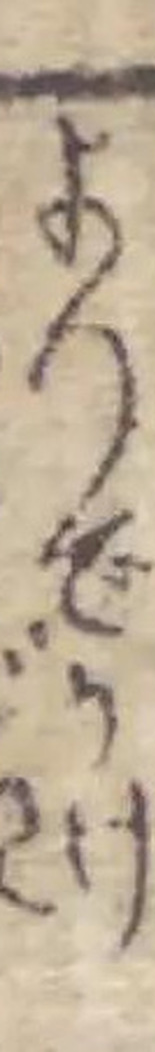よりでかけ
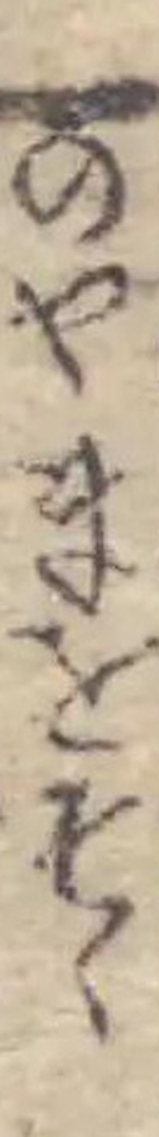のやまをそゝ
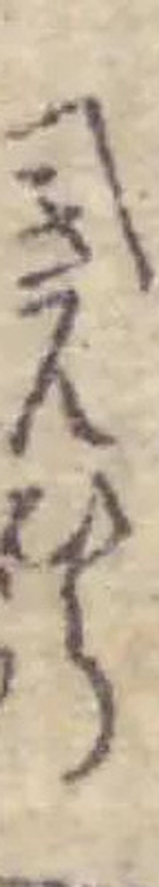〽きんひら
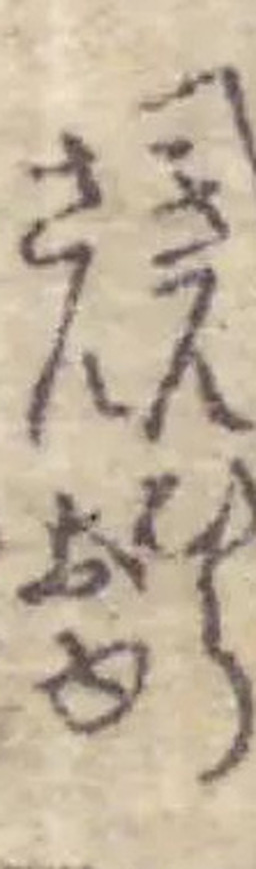さんおゆ
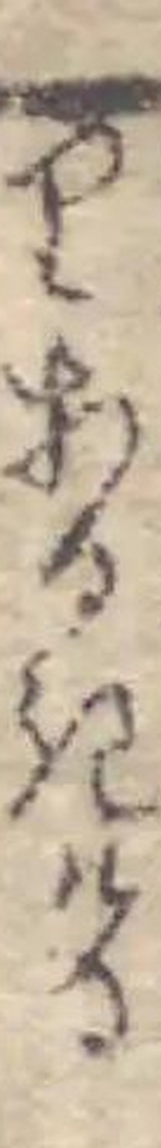りあるきける
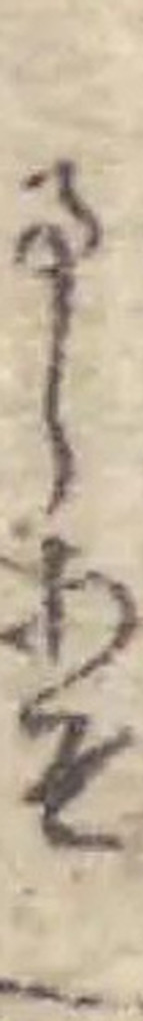るしあそ
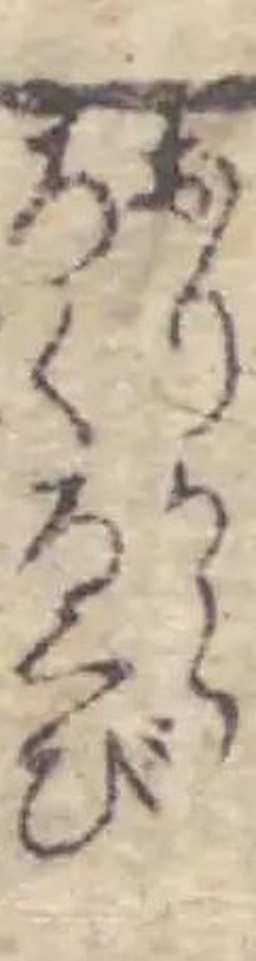ろくろくび
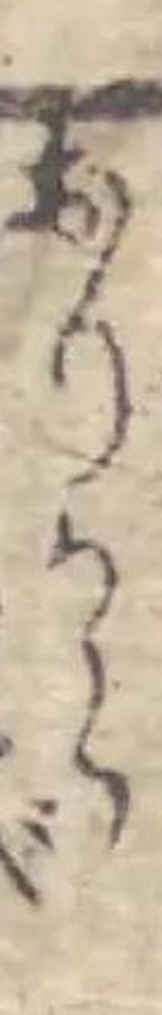おりから
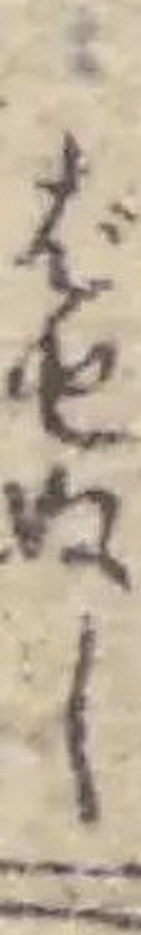ばせぬし
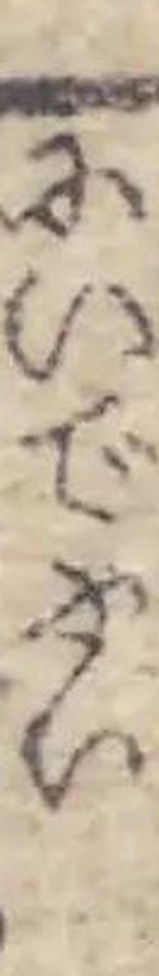にいでやい
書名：化物尽 4巻
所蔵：国立国会図書館 National Diet Library, JAPAN
